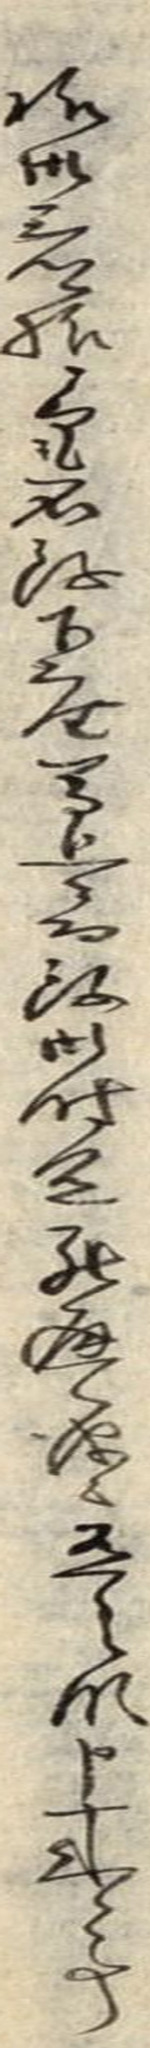様御三卿様にても不致下座馬上にて致御時宜罷通候儀に有之段申来候事
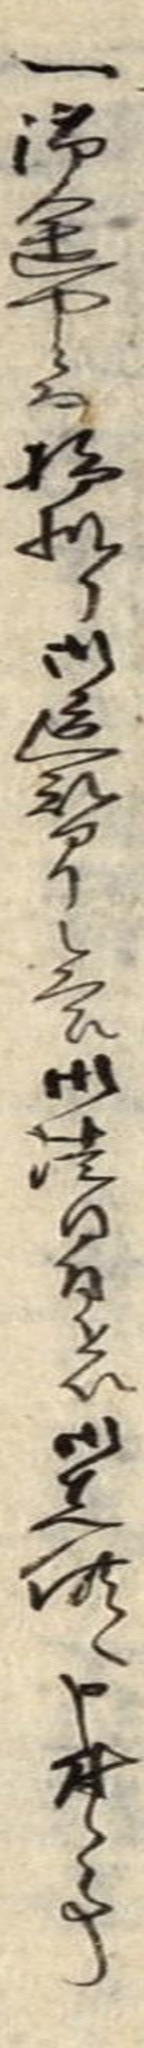一御途中にて指掛り御道替り之節御徒目付を以御先供へ申付候事
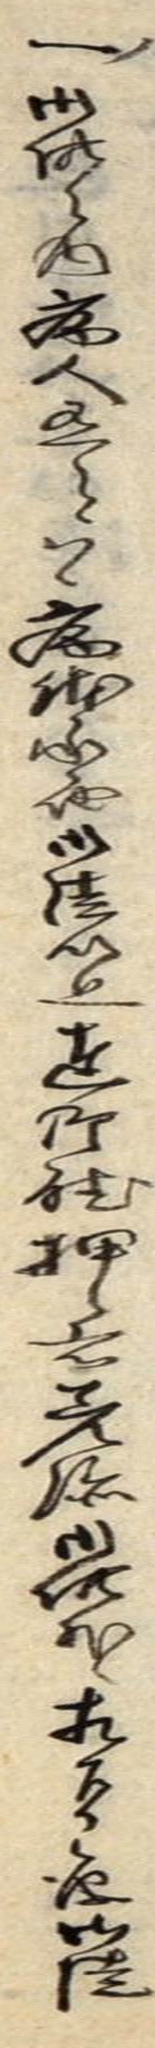一御供之内病人有之候はゝ病体承届御徒以上達御聴押之者差添御供外へ相下り候儀御徒
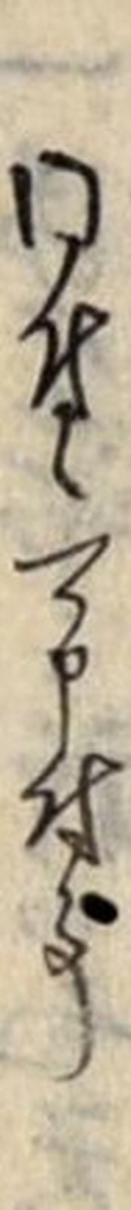目付へ可申付事

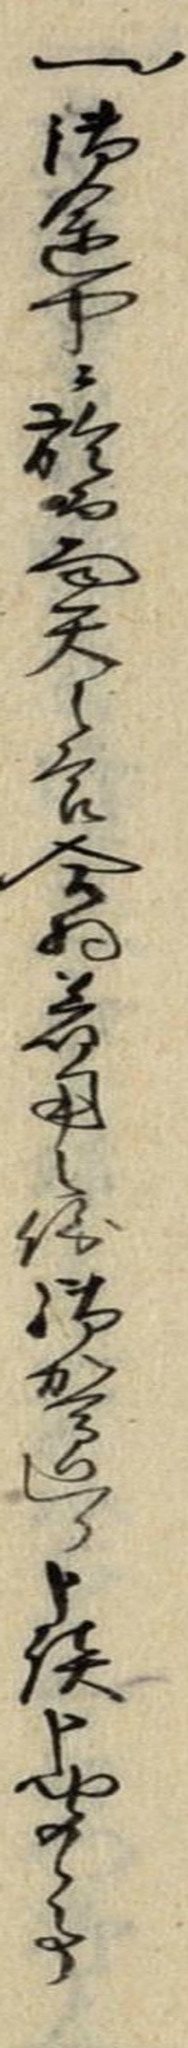一御途中に於て雨天之節合羽着用之儀御駕廻り申談申聞候事
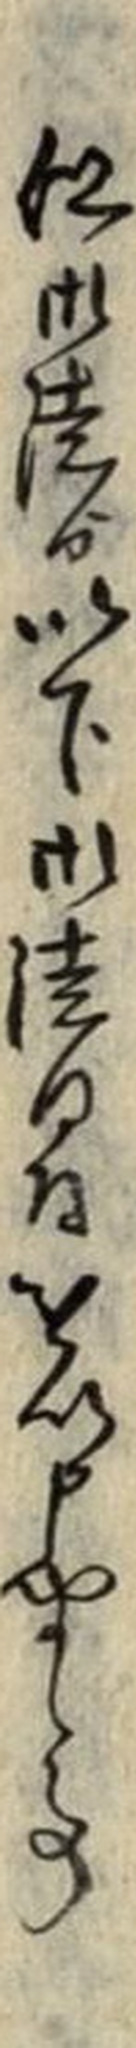但御徒ゟ以下御徒目付を以申聞候事
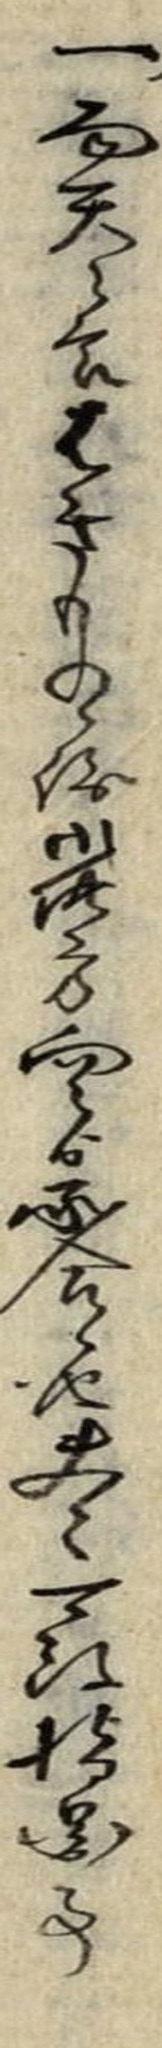一雨天之節はきものゝ儀御供方向々ゟ承合候儀夫々可致指図事
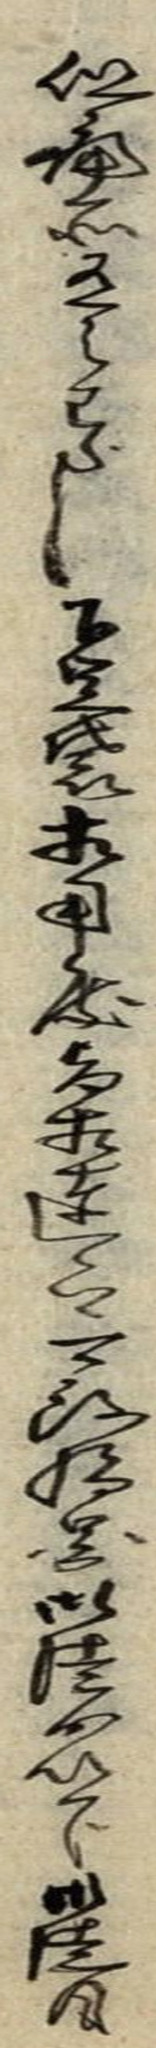但痛所有之わらし下足袋相用度旨相達候はゝ可致指図御徒ゟ以下御徒目
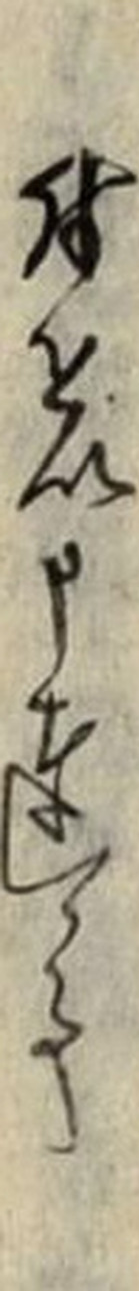付を以申達候事
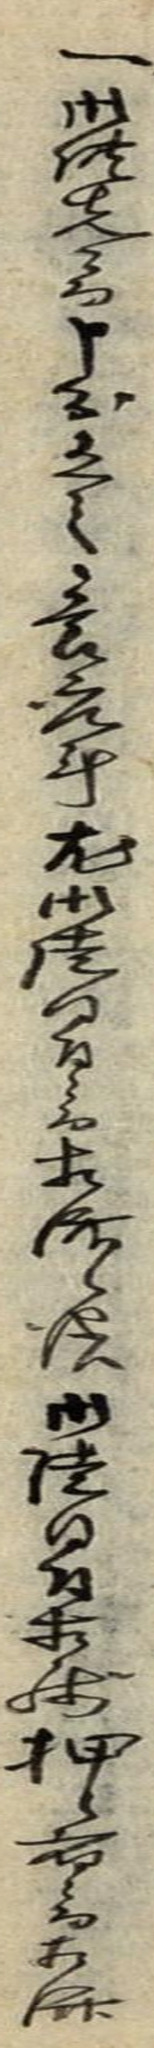一御供先にて申分有之候節取計尤御徒目付にて相済候儀は御徒目付相残押之者にて相済
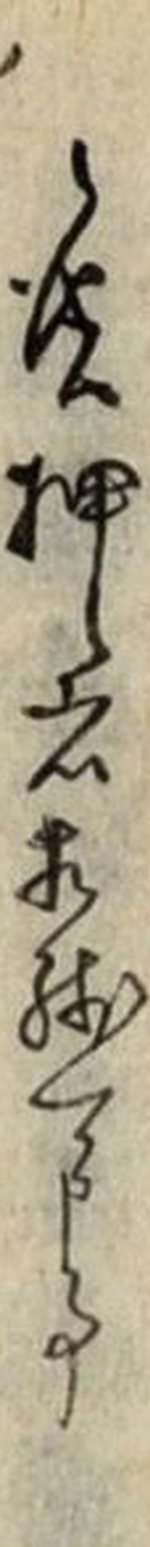候儀は押之者相残可申事
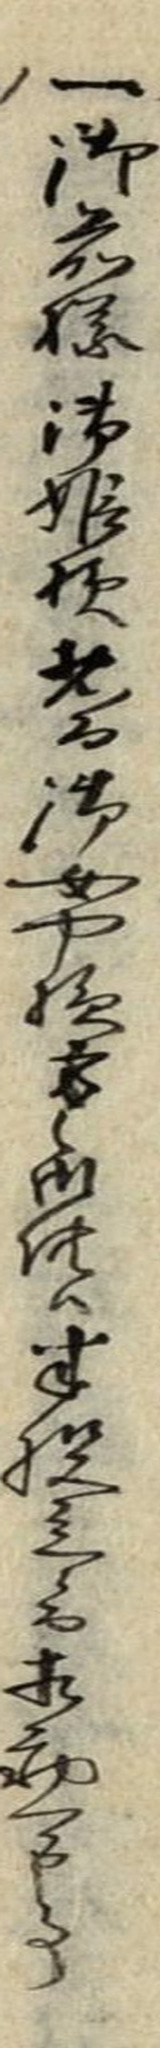一御前様御姫様惣て御女中様方之御供は半股立にて相勤可申事
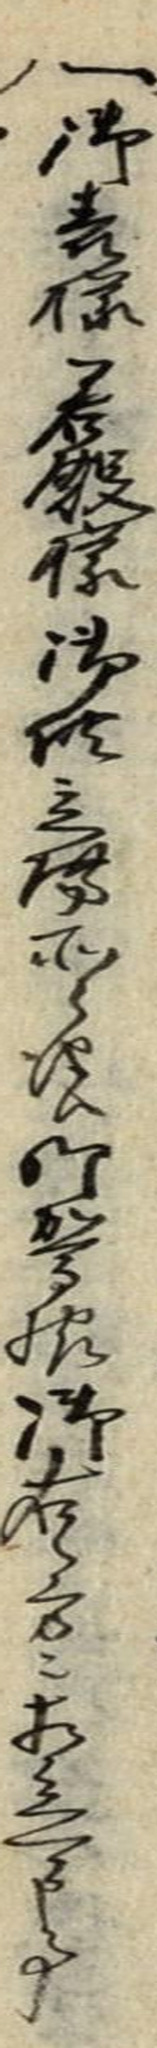一御表様若殿様御供立場所之儀は御駕脇御右之方に相立可申事
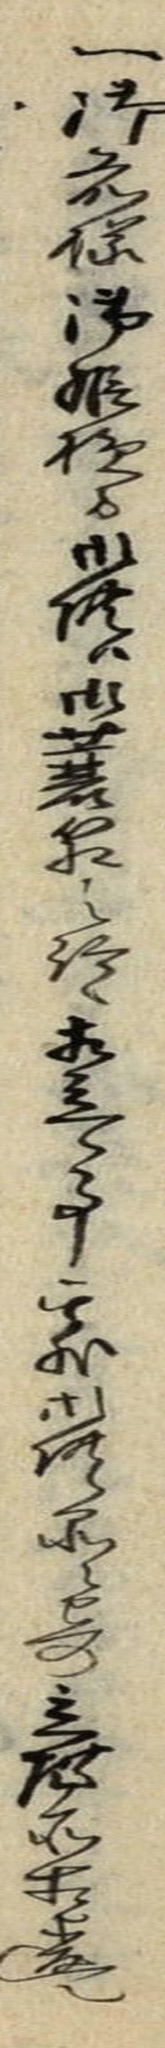一御前様御姫様方御供は御簑箱之跡へ相立候事其外御供之品に寄立場所相違之
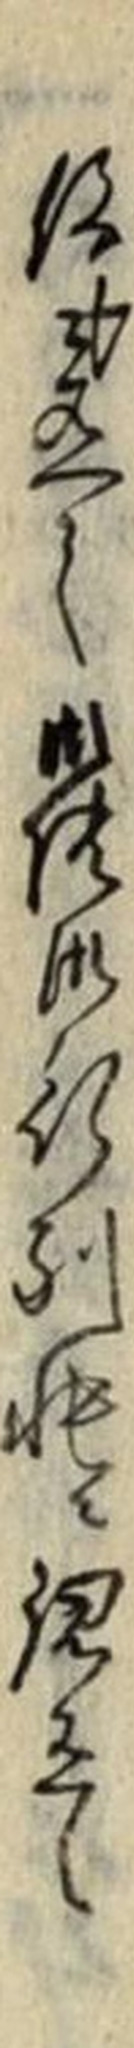儀も有之御供御行列帳に認有之
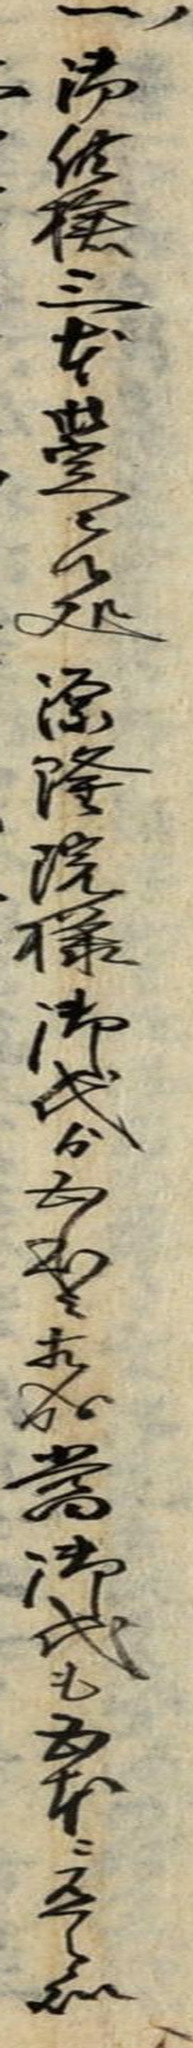一御供槍三本御定に候処源隆院様御代ゟ五本に相成当御代も五本に有之候処
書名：三都并道中之部
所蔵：福井県文書館 Fukui Prefectural Archives
